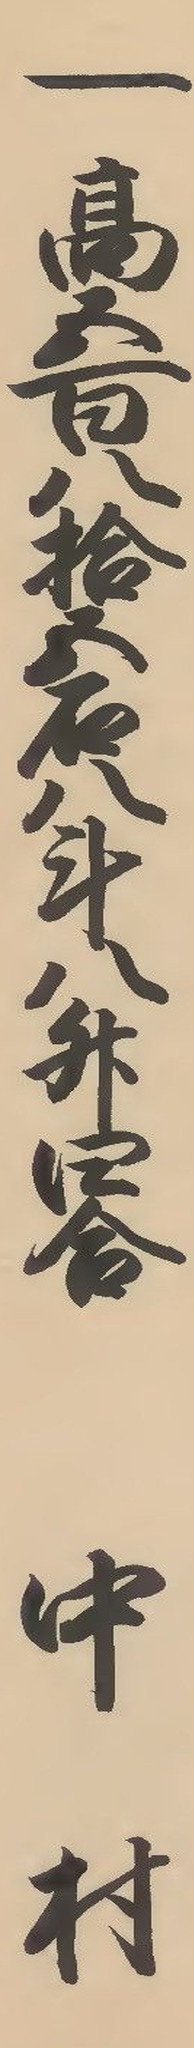一高五百八拾五石八斗八升四合中村
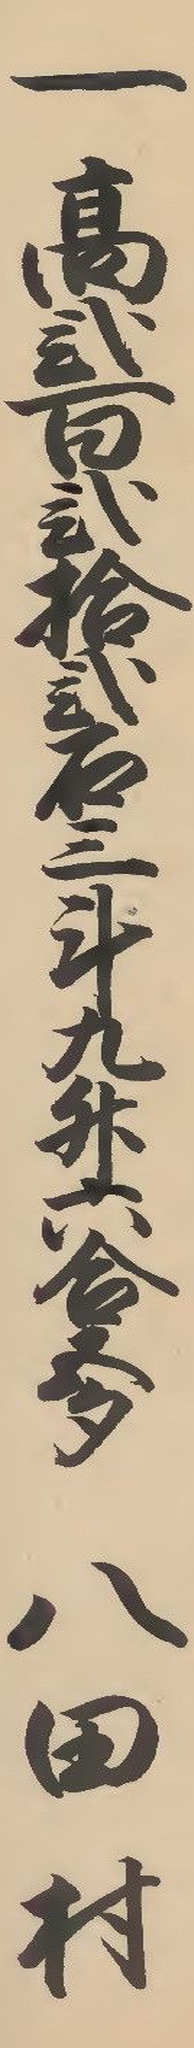一高弐百弐拾弐石三斗九升六合五勺八田村
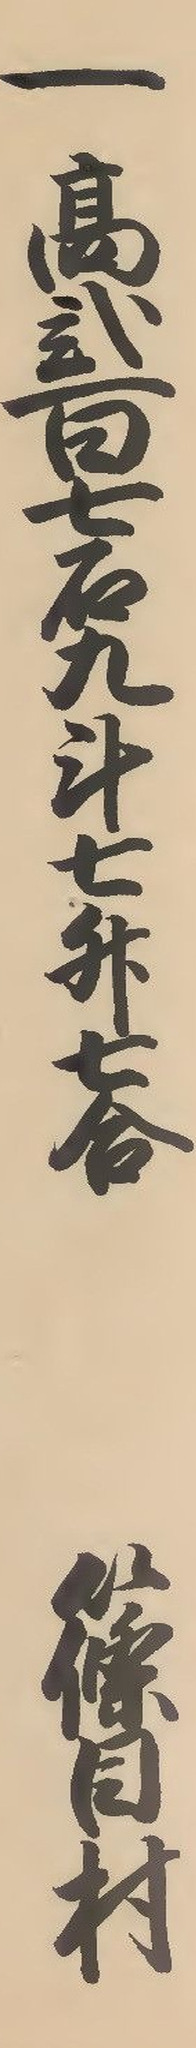一高弐百七石九斗七升七合篠目村
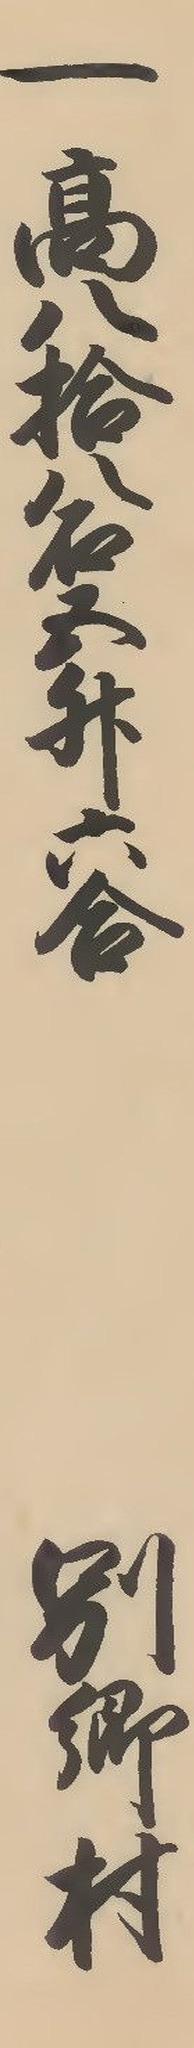一高八拾八石五升六合別郷村
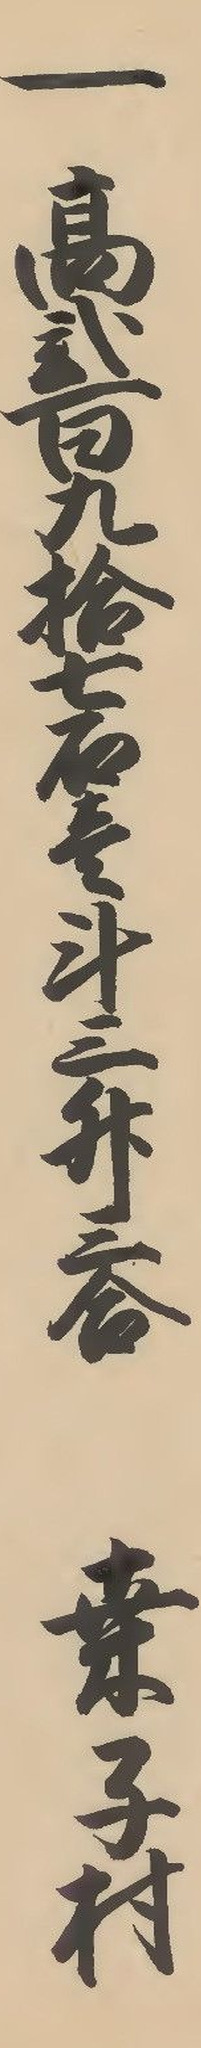一高弐百九拾七石壱斗三升三合桑子村
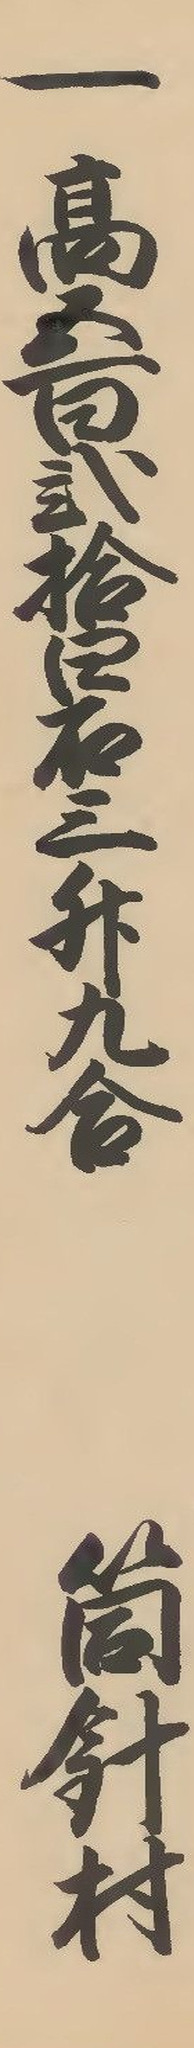一高五百弐拾四石三升九合筒針村

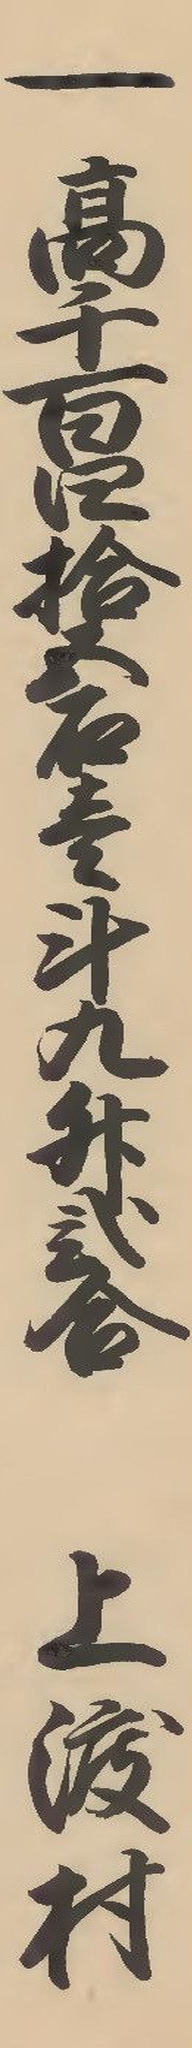一高千百四拾五石壱斗九升弐合上渡村
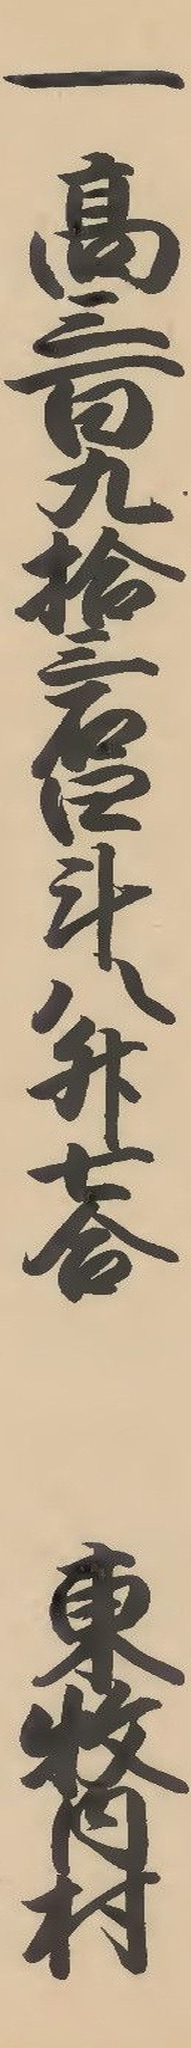一高三百九拾三石四斗八升七合東牧内村
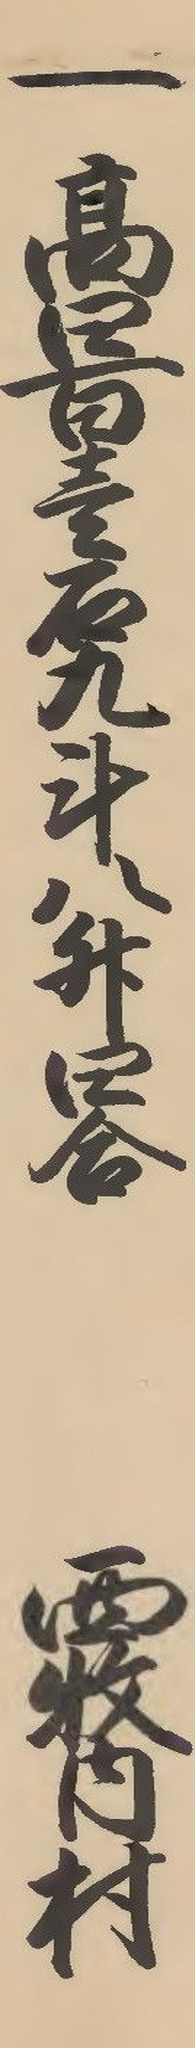一高四百壱石九斗八升四合西牧内村
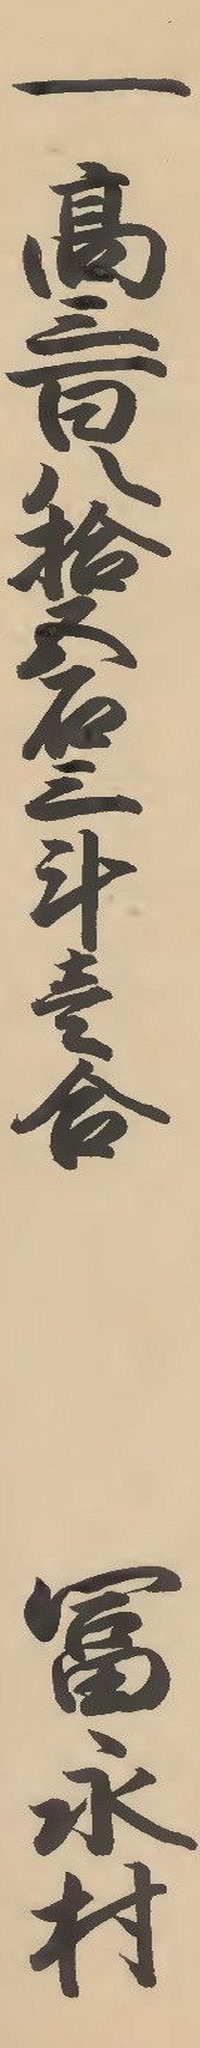一高三百八拾五石三斗壱合富永村
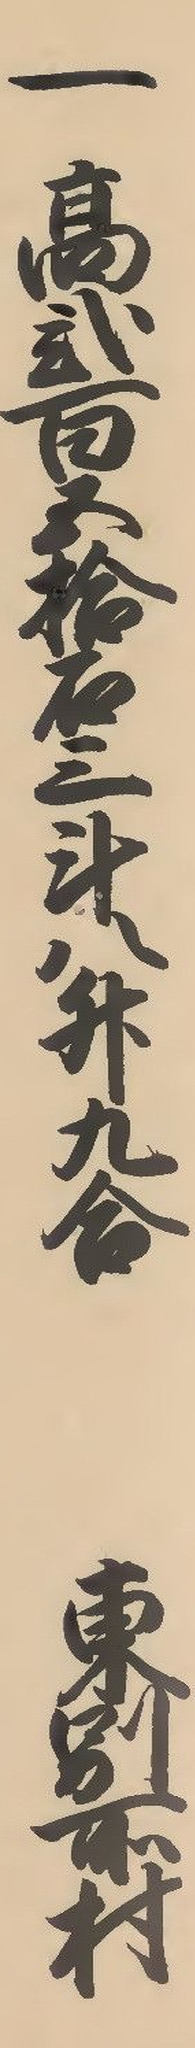一高弐百五拾石三斗八升九合東別所村
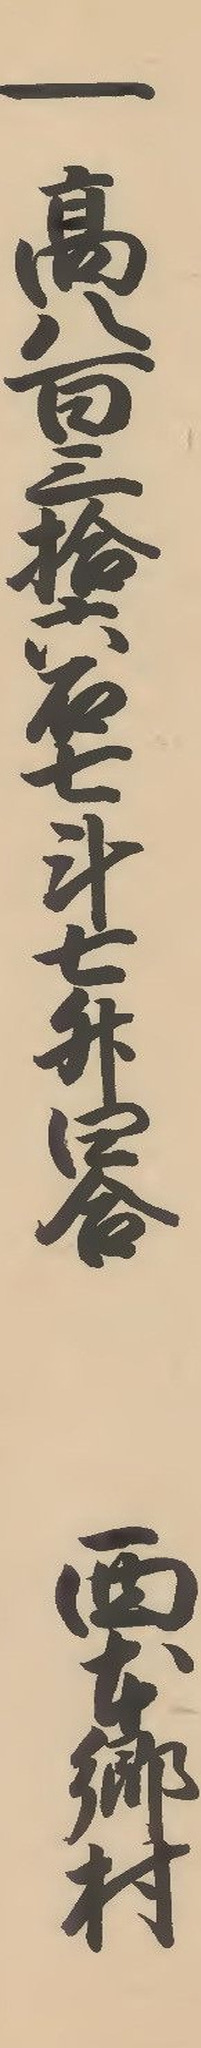一高八百三拾六石七斗七升四合西本郷村
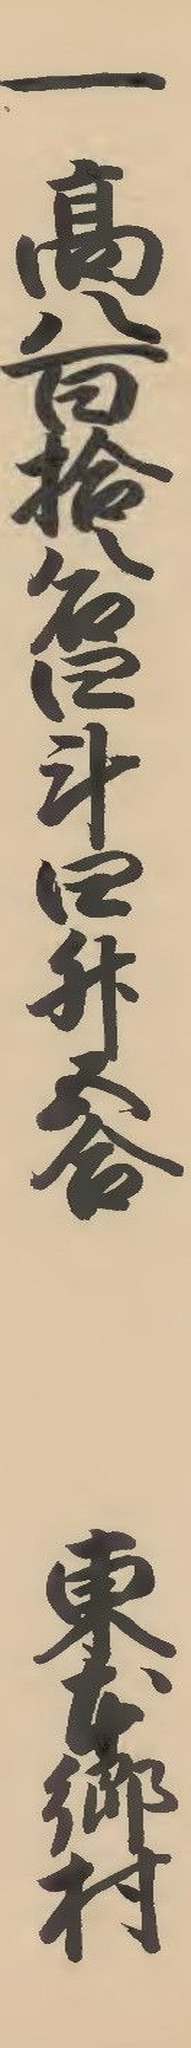一高八百拾八石四斗四升五合東本郷村
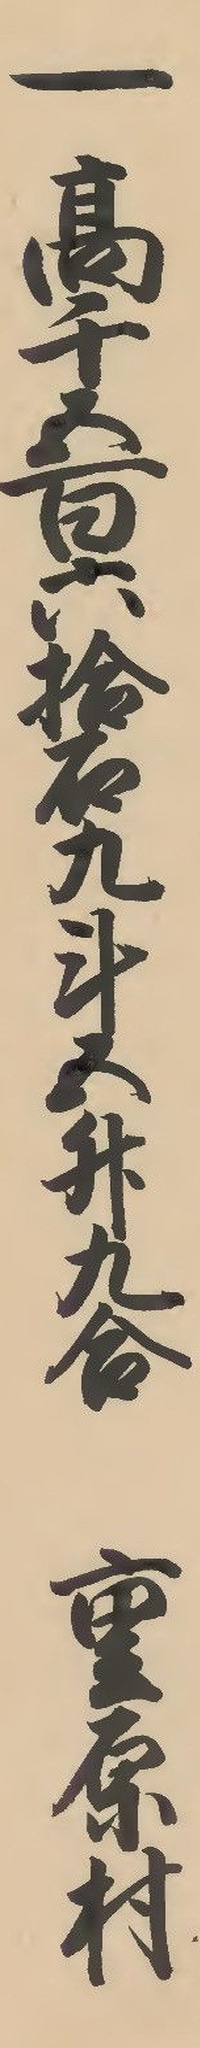一高千五百六拾石九斗五升九合重原村

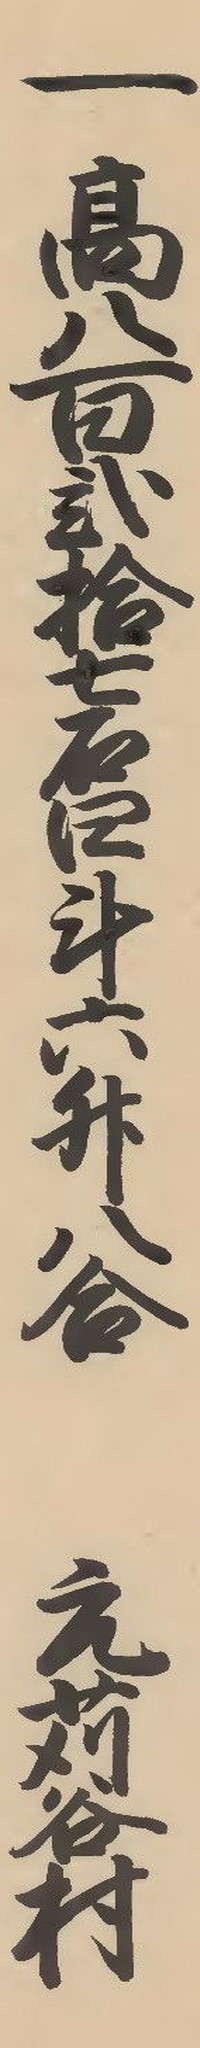一高八百弐拾七石四斗六升八合元苅谷村
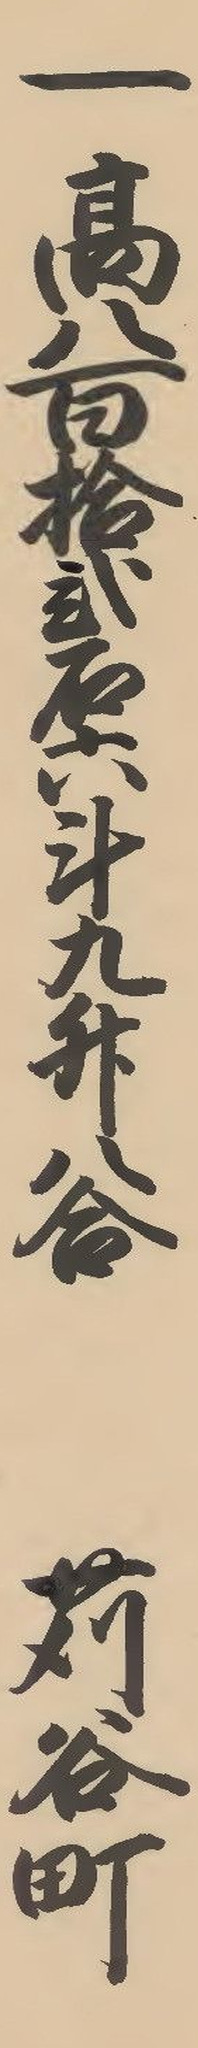一高八百拾弐石六斗九升八合苅谷町
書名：三河国郷帳
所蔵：国立公文書館 National Archives of Japan
